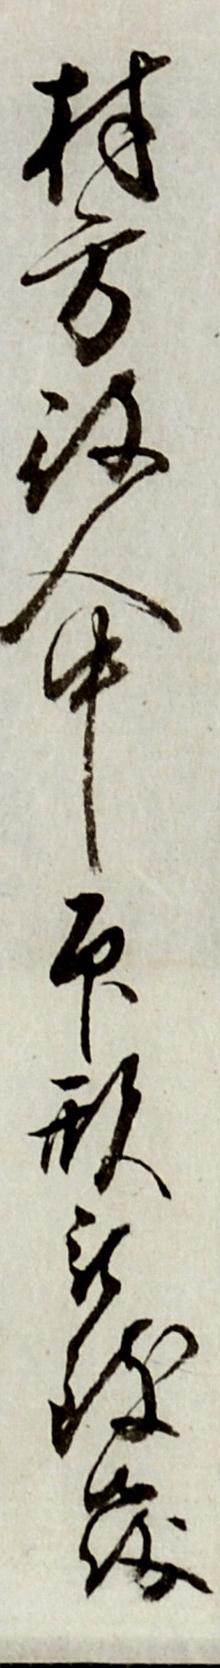村方役人中印形被致候儀
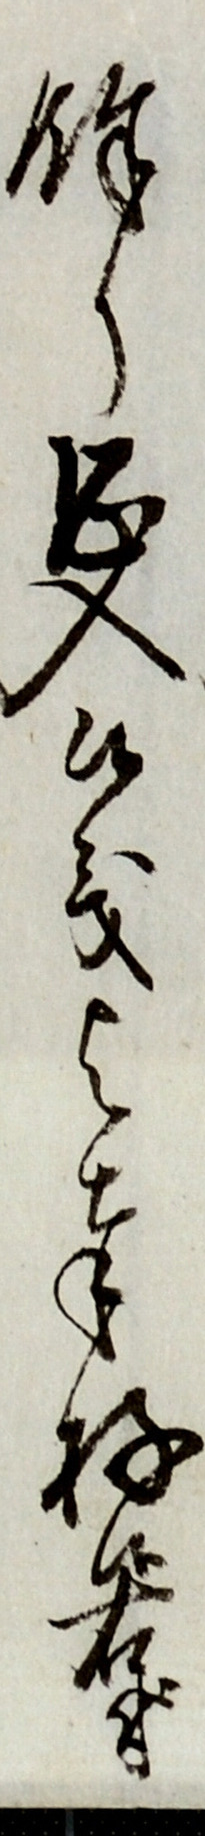餘り恐入候義与奉存候右ニ付
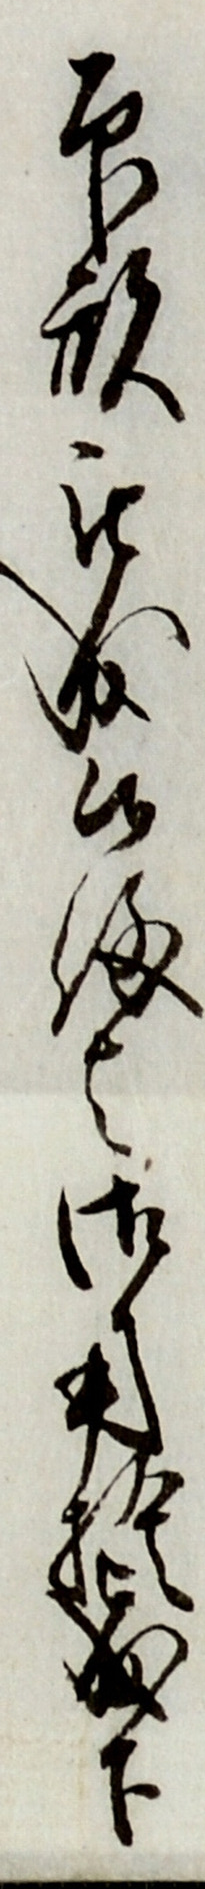印形被成候儀者御用捨被成下
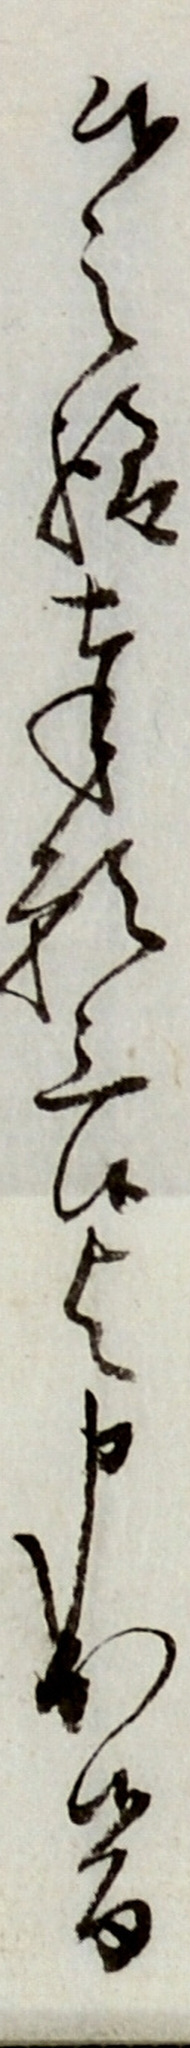候之様奉願上候与申出候間
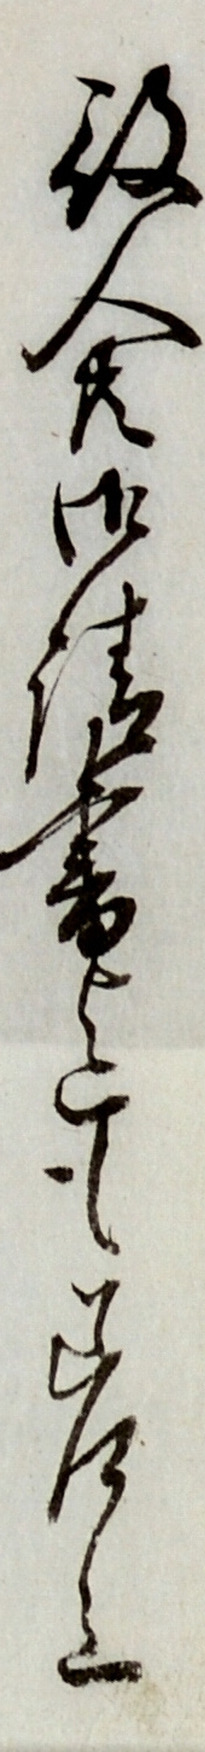役人共御請書迄も差上
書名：野呂川開発関係書
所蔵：伊那市立高遠町図書館・合同会社AMANE
